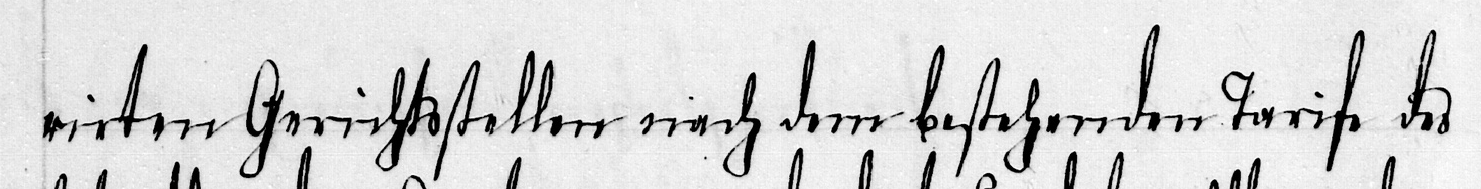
rirten Gerichtsstellen nach dem bestehenden Tarife des
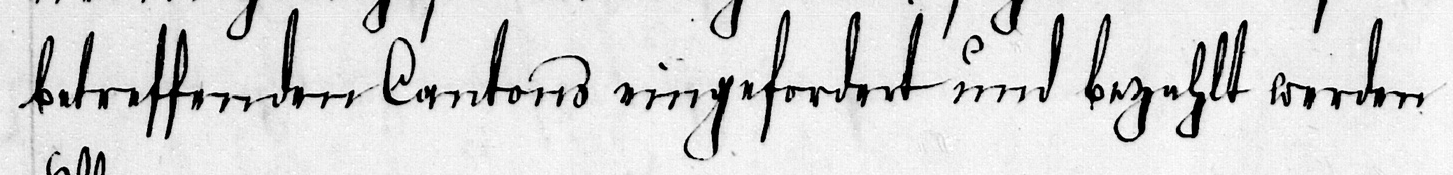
betreffenden Cantons eingefordert und bezahlt werden
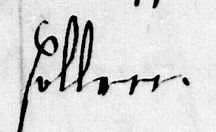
sollen.
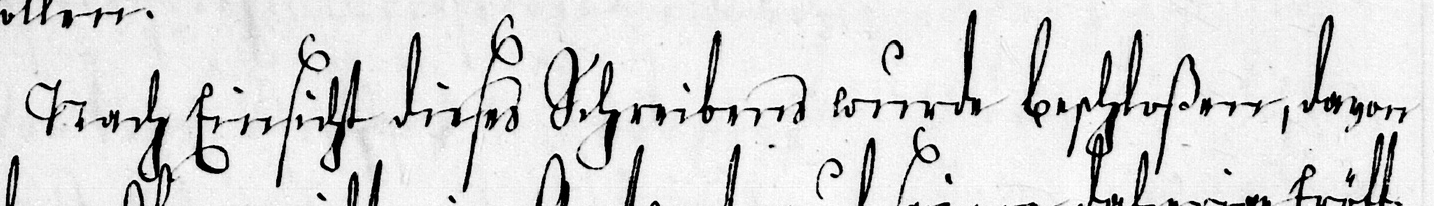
Nach Einsicht dieses Schreibens wurde beschloßen, davon
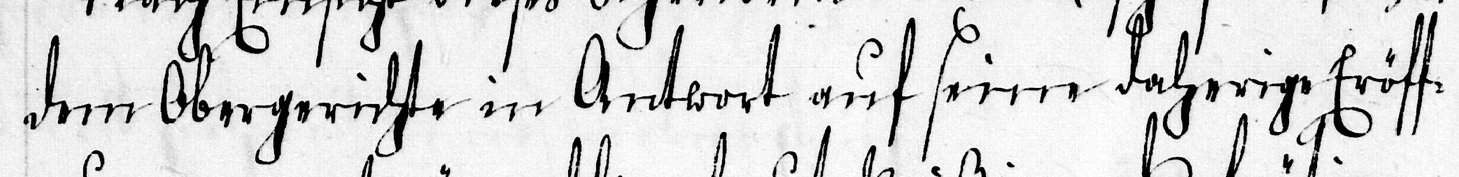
dem Obergerichte in Antwort auf seine daherige Eröf¬
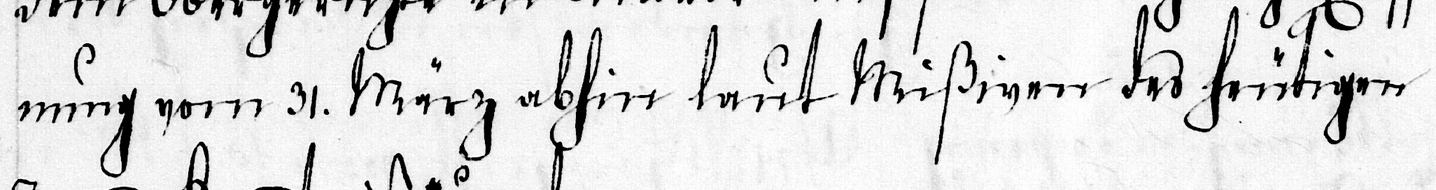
fnung vom 31. März abhin laut Mißiven des heutigen
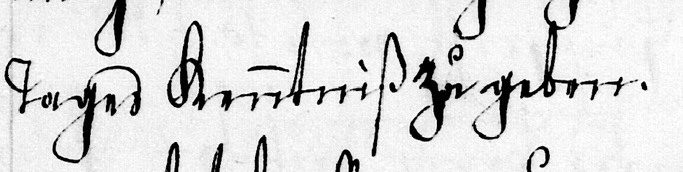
Tages Kenntniß zu geben.
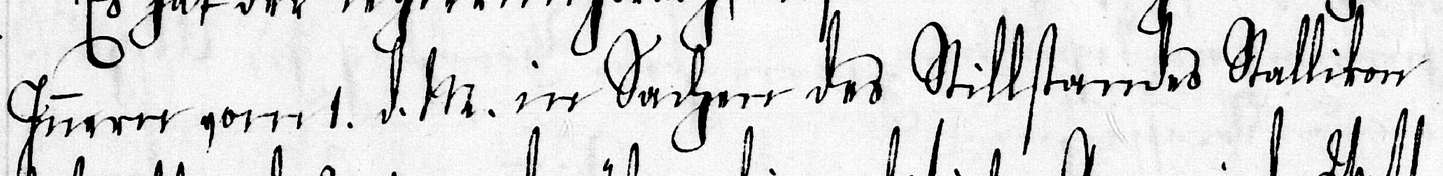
Innern vom 1. d. M. in Sachen des Stillstandes Stallikon
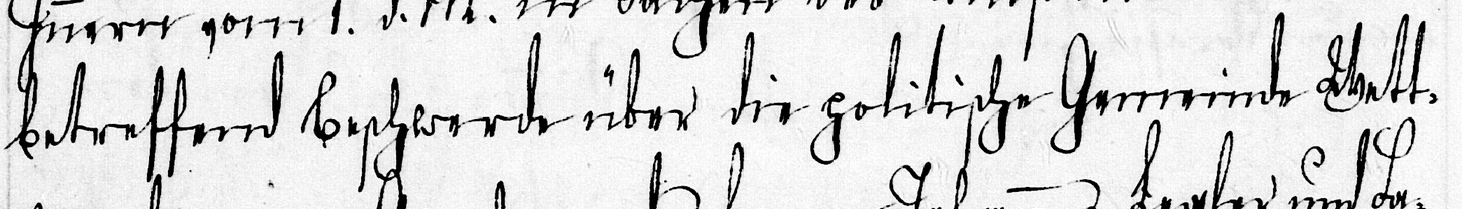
betreffend Beschwerde über die politische Gemeinde Wett¬
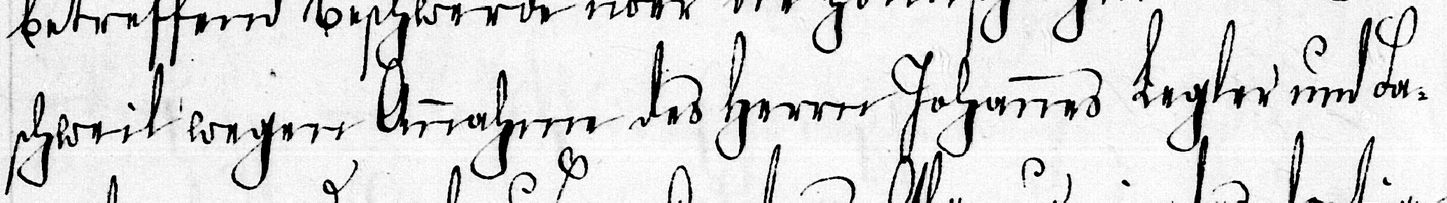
schweil wegen Annahme des Herrn Johannes Legler und Fa¬
